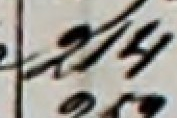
214
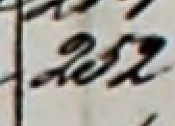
252
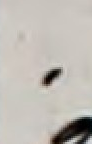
„
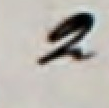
2
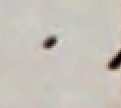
„
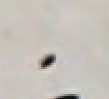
„
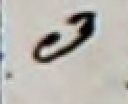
3
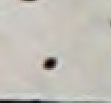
„ 7
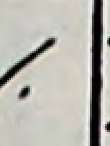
./.
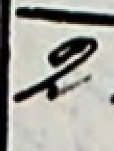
2
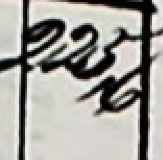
225,6
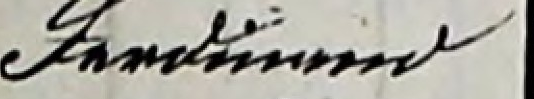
Ferdinand
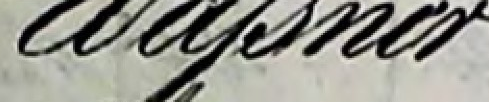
Wassner
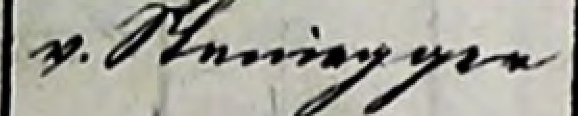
v. Steinegger
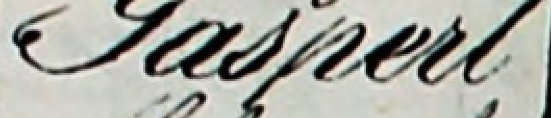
Gasperl
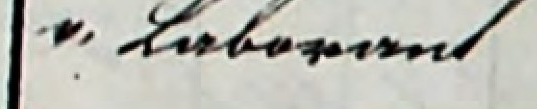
v. Laberant
